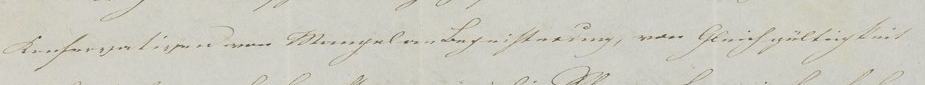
Konservativen von Mangel an Begeisterung, von Gleichgültigkeit
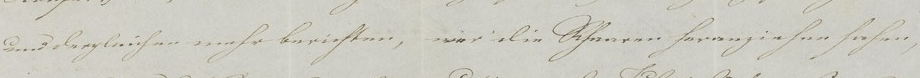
und dergleichen mehr berichten, wer die Schaaren heranziehen sahen,
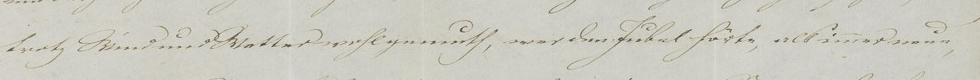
trotz Wind und Wetter wohlgemuth, wer den Jubel hörte, als immer neue,
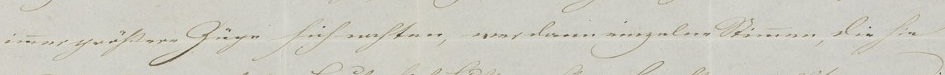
immer größere Züge sich nahten, wer dann einzelne Stimmen, die hie
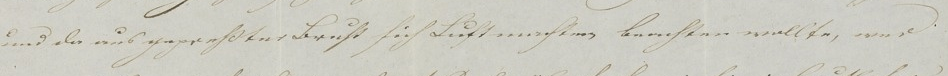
und da aus gepreßter Brust sich Luft machten, beachten wollte, wer
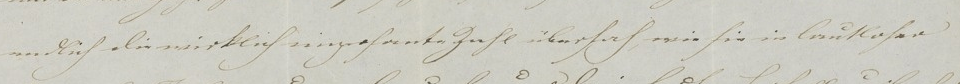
endlich die wirklich imposante Zahl übersah, wie sie in lautloser
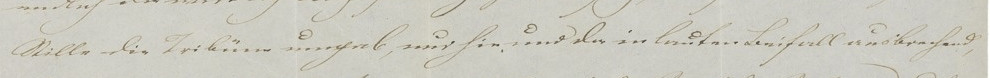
Stille die Tribüne umgab, nur hie und da in lauten Beifall ausbrechend,
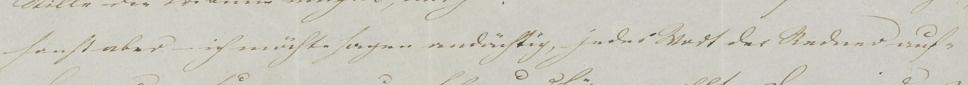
sonst aber ­ ich möchte sagen andächtig, jedes Wort der Redner auf-
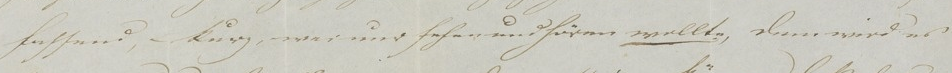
fassend, – kurz, wer nur sehen und hören wollte, dem wird es
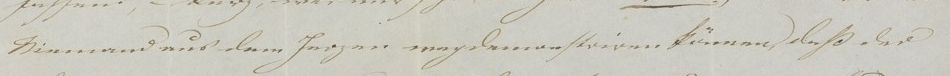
Niemand aus dem Herzen wegdemonstriren können, daß der
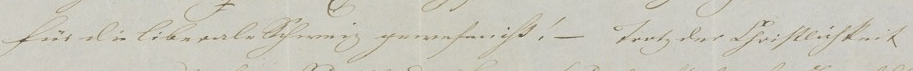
für die liberale Schweiz gewesen ist! – Trotz der Christlichkeit
